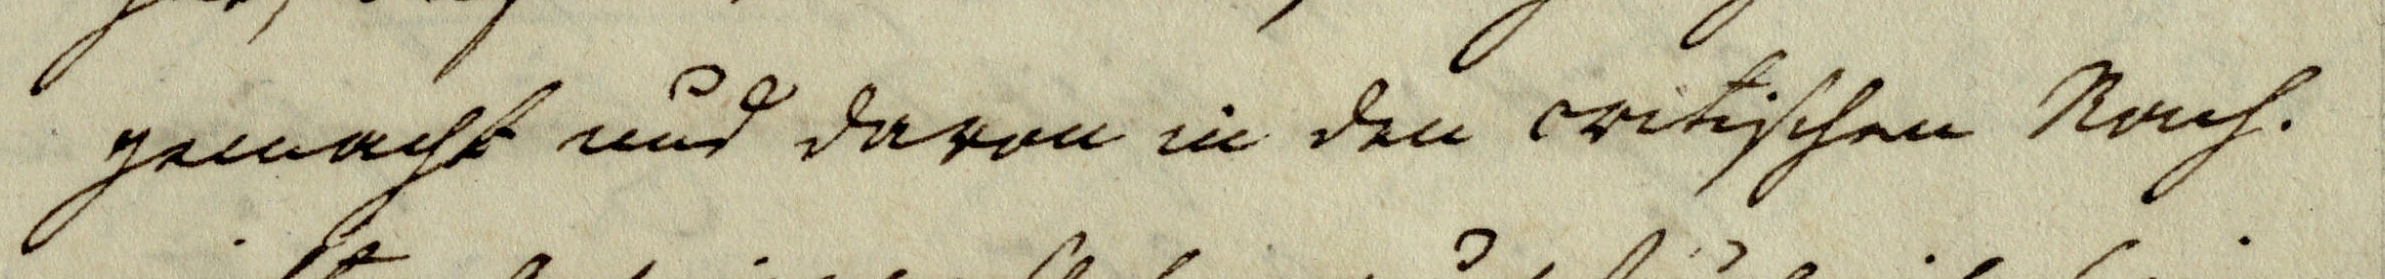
gemacht und davon in den critischen Nach¬
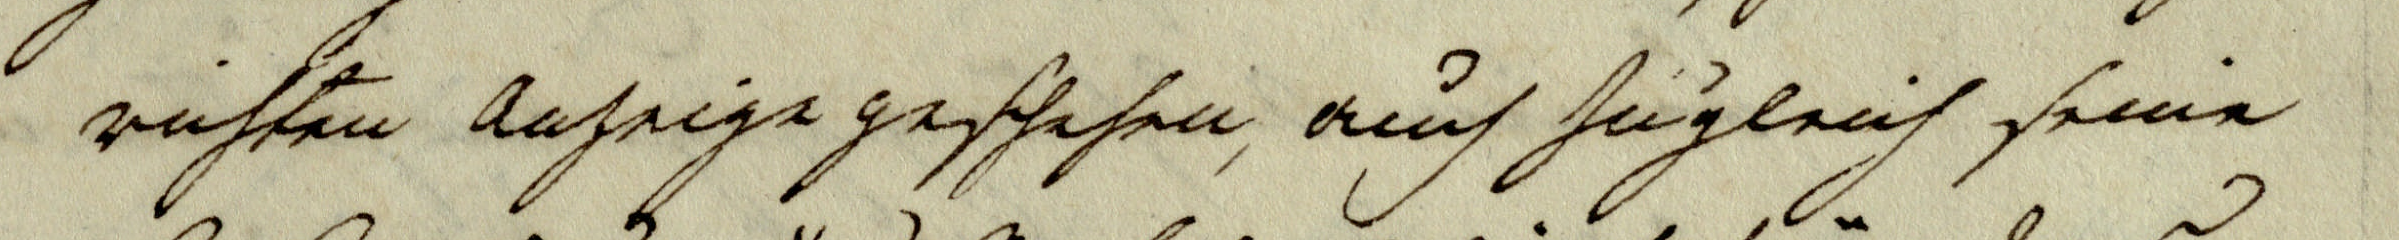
richten Anzeige geschehen, auch zugleich seine
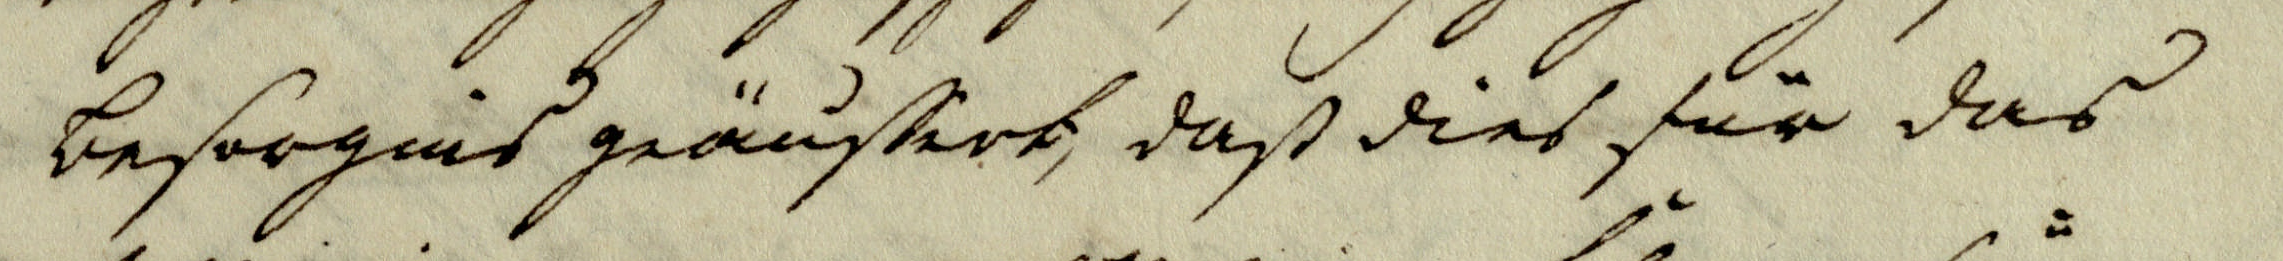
Besorgnis geäussert, daß dies für das
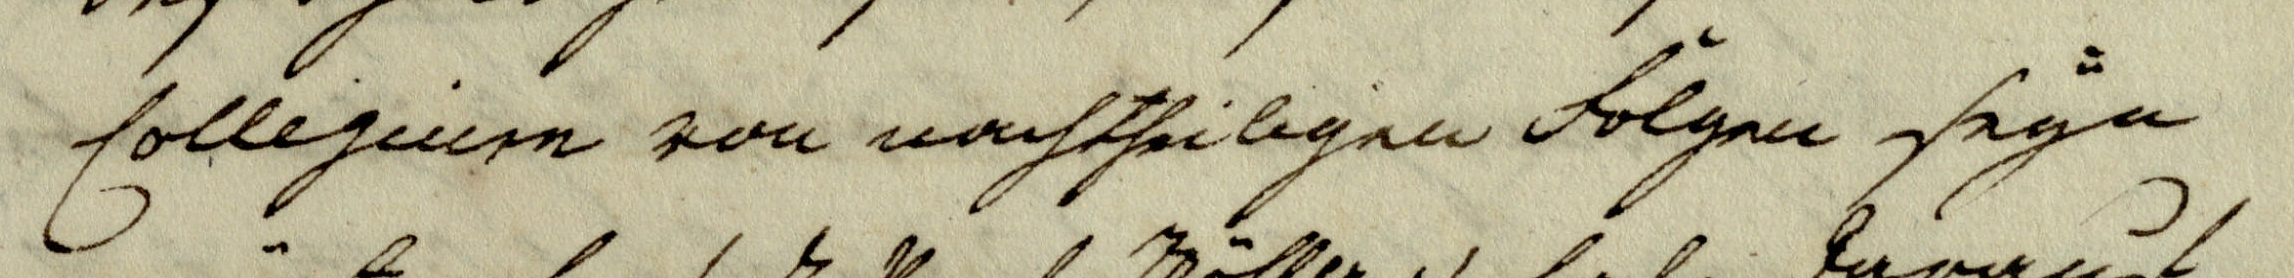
Collegium von nachtheiligen Folgen seÿn
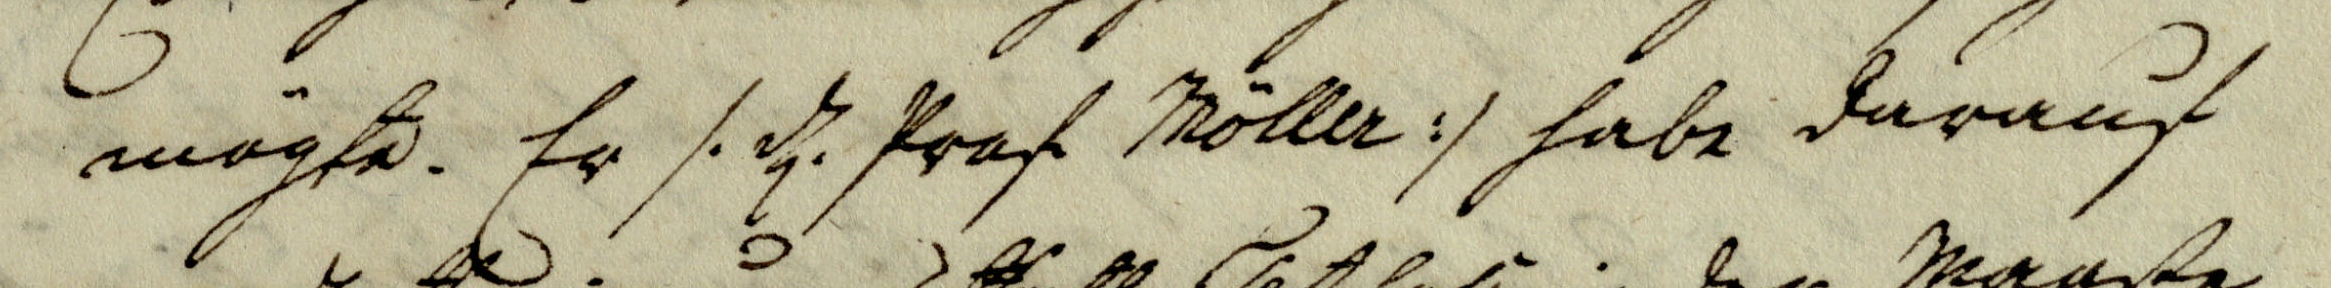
mögte. Er /. dh. Prof. Möller :/ habe darauf
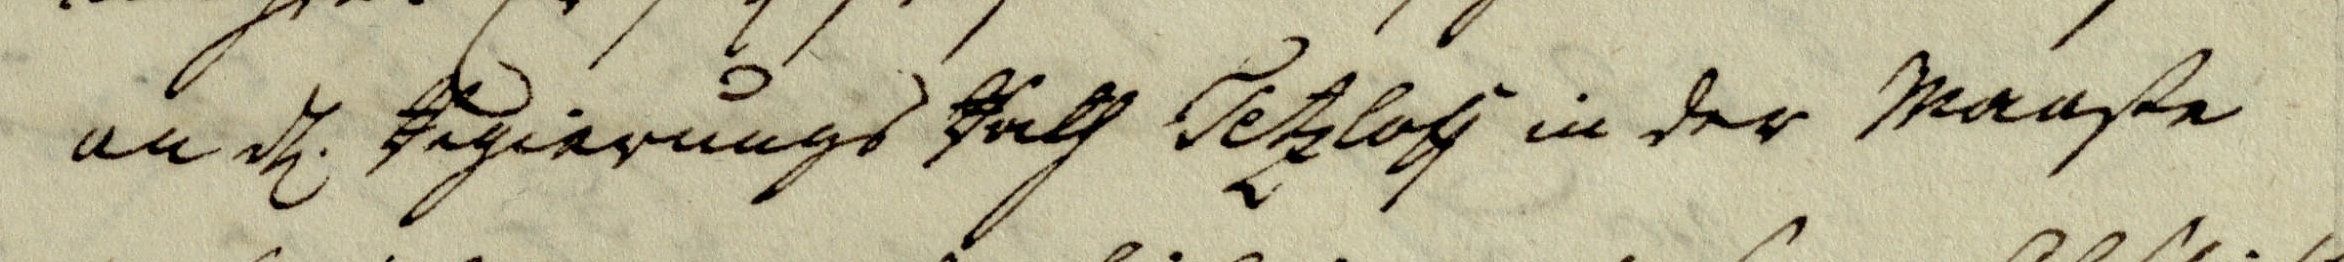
an dh. Regierungs Rath Tetzloff in der Maaße
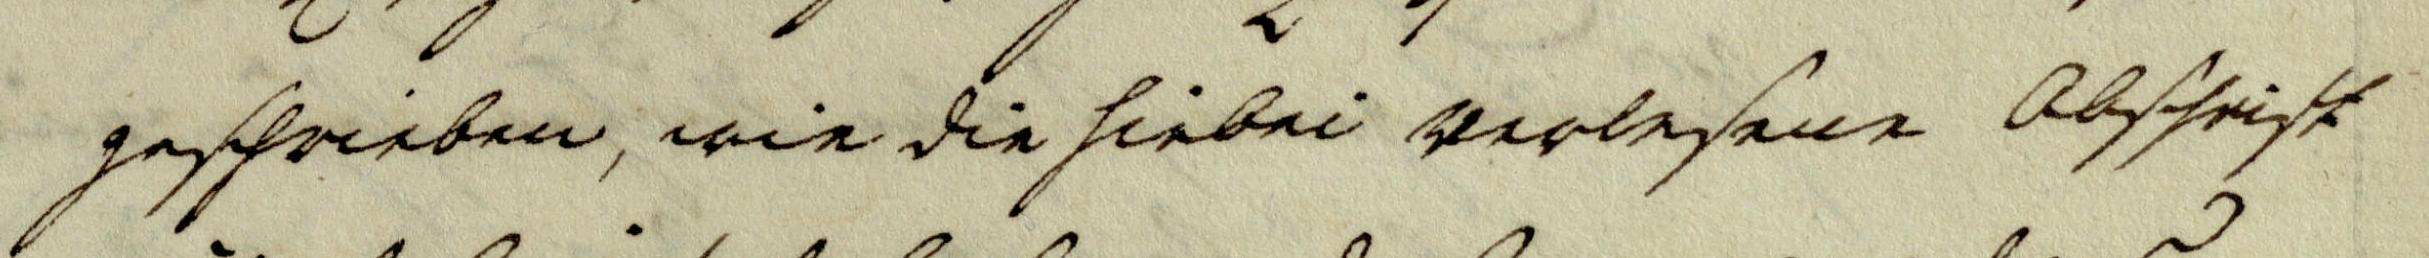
geschrieben, wie die hiebei verlesene Abschrift
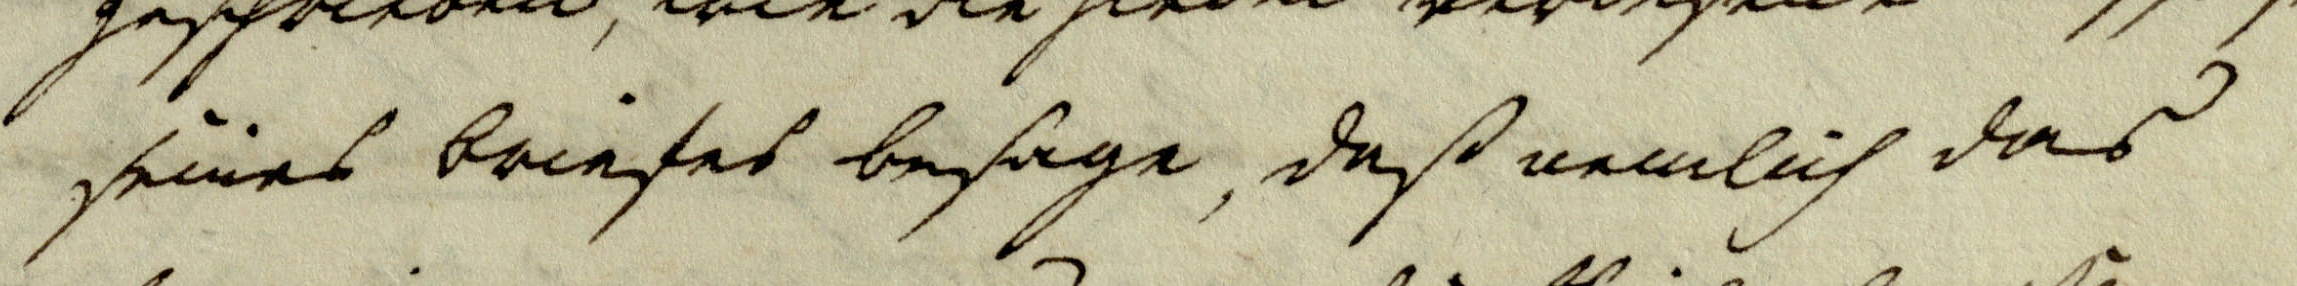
seines Briefes besage, daß nemlich das
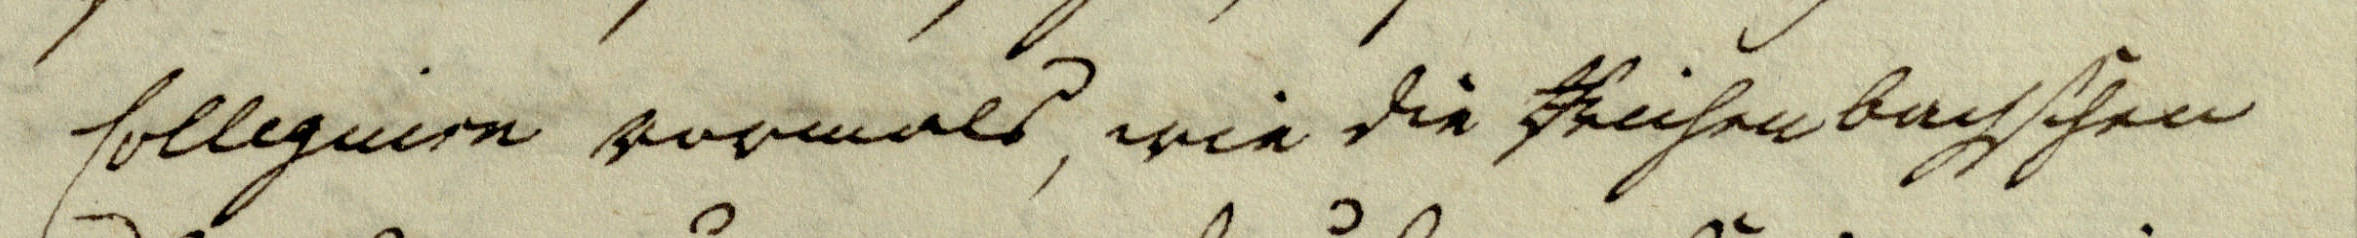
Collegium vormals, wie die Reichenbachschen
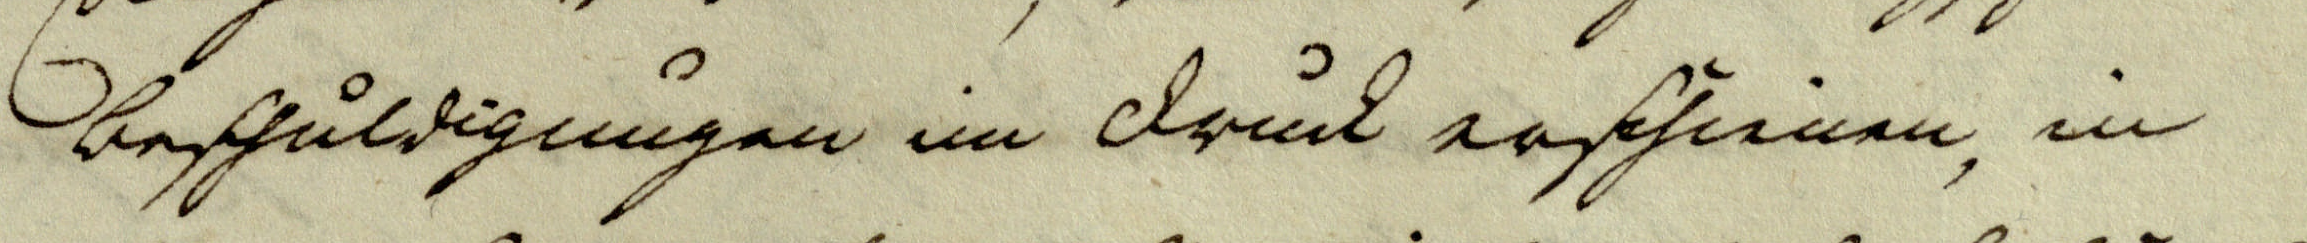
Beschuldigungen im Druck erschienen, in
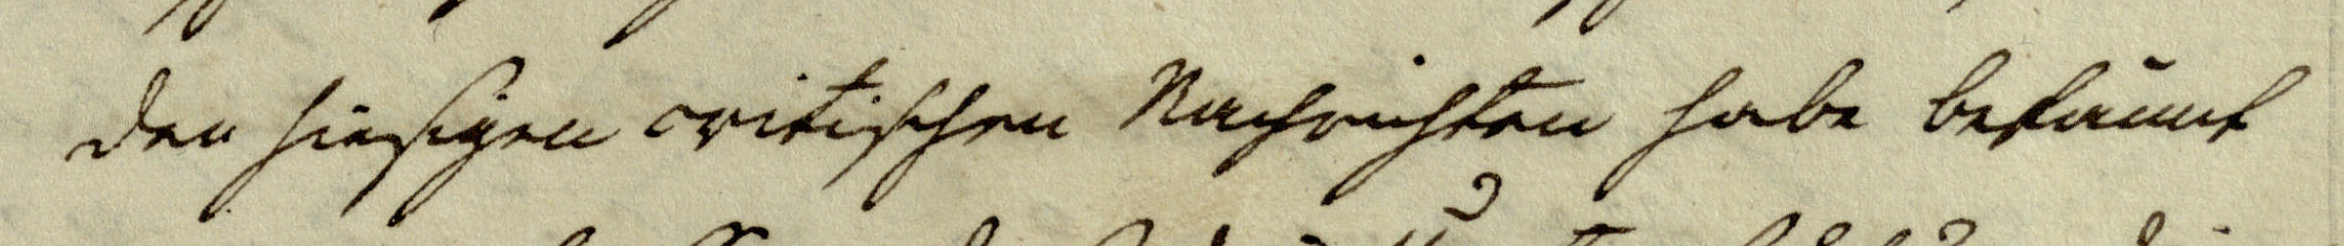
den hiesigen critischen Nachrichten habe bekannt
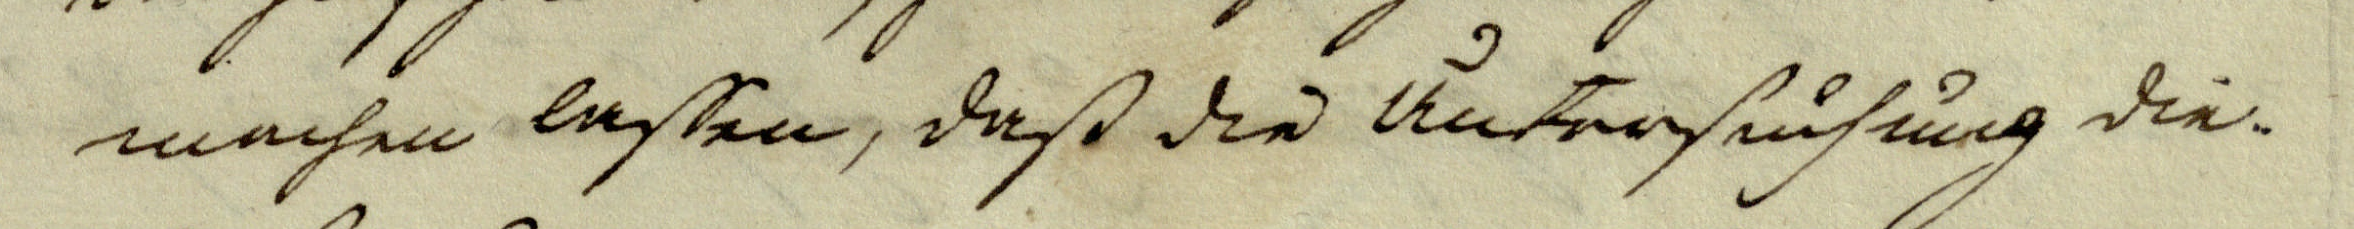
machen lassen, daß die Untersuchung die¬
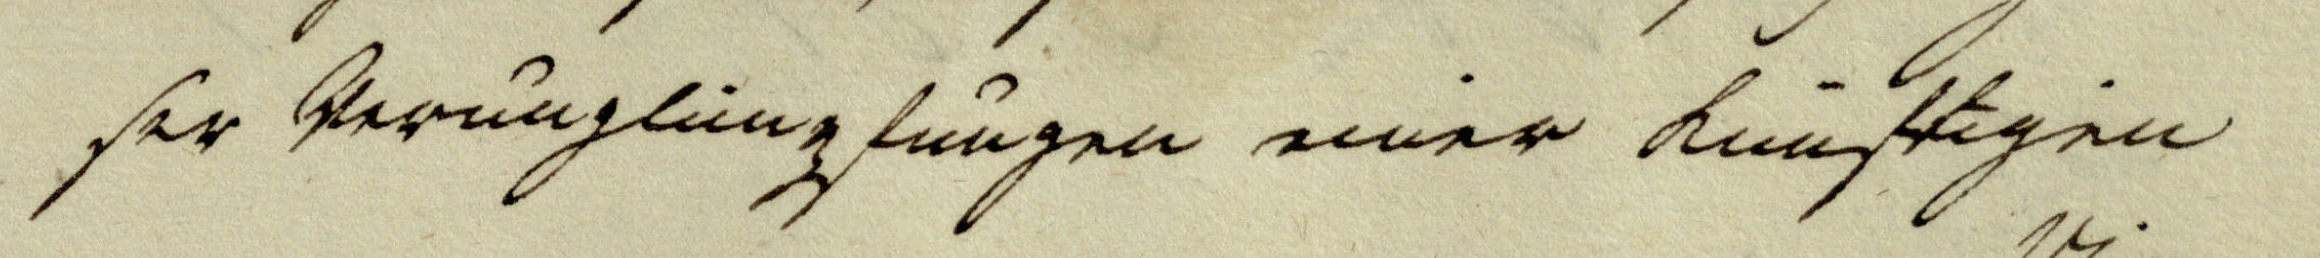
ser Verunglimpfungen einer künftigen
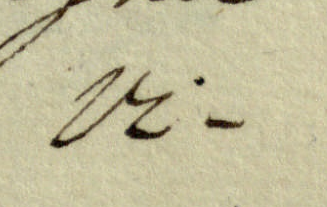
Vi¬
